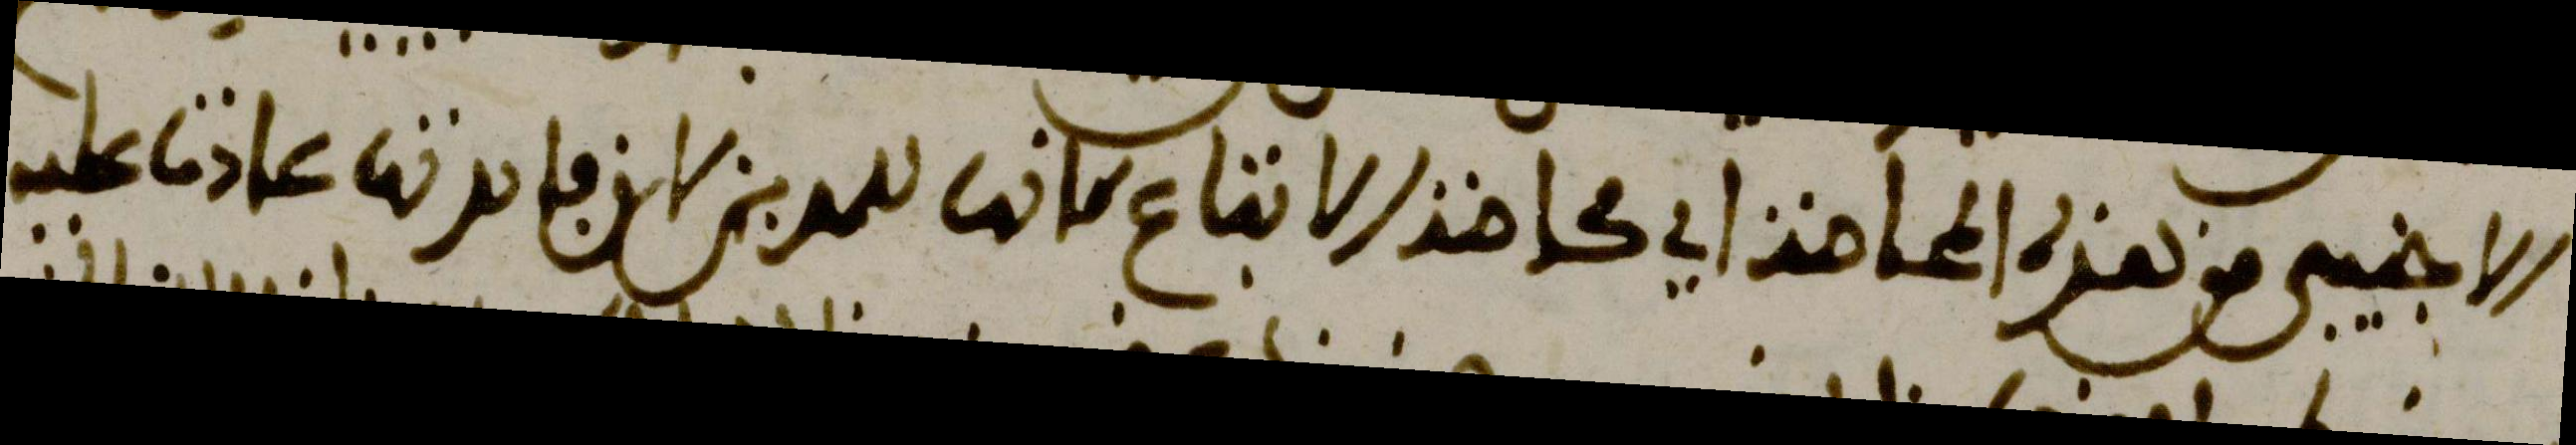الاجنبي من هذه المحاصة اي محاصة الابتاع كانها للمدين لان فاىدتها عادت عليه
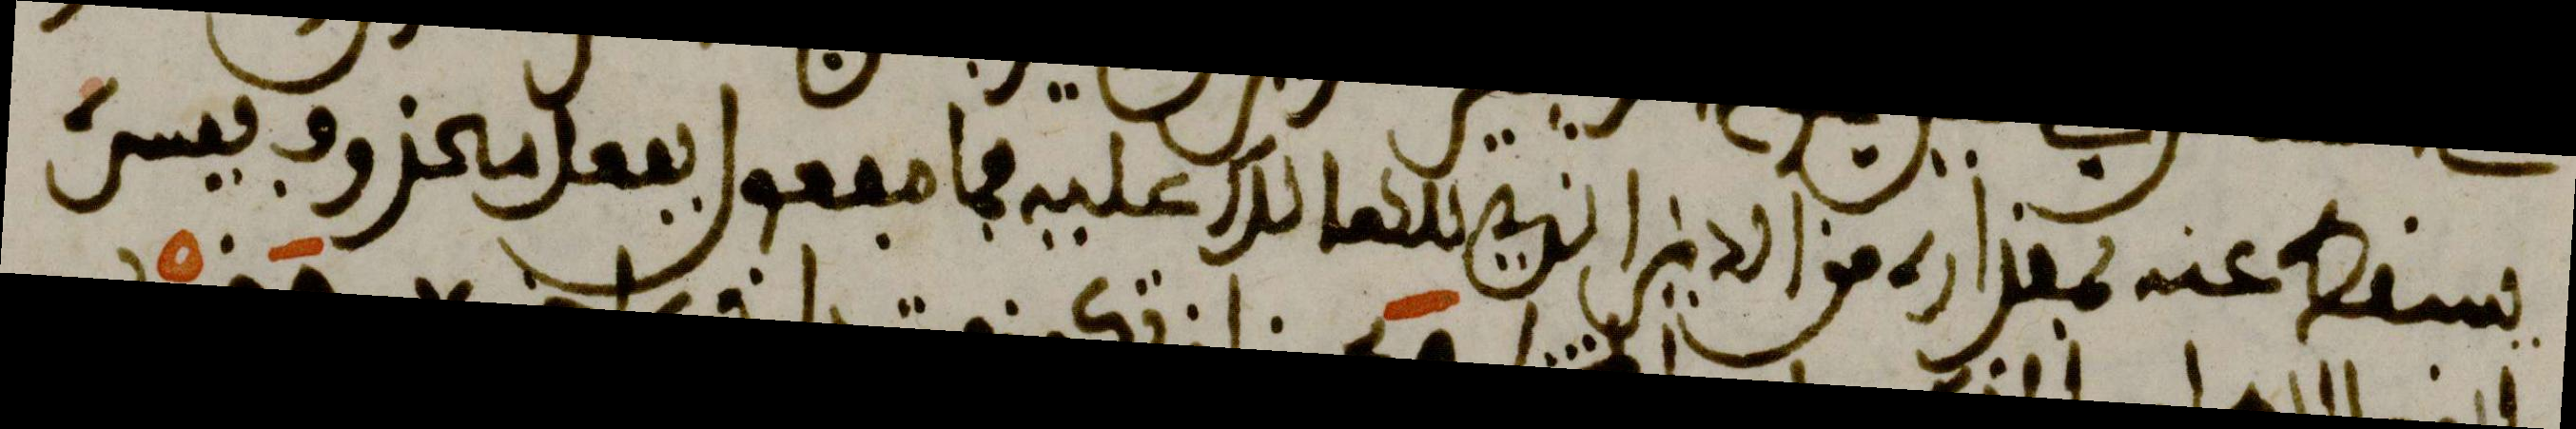يسقط عنه بمقداره من الدين الذي للهالك عليه فما مفعول يفعل محذوف يفسره
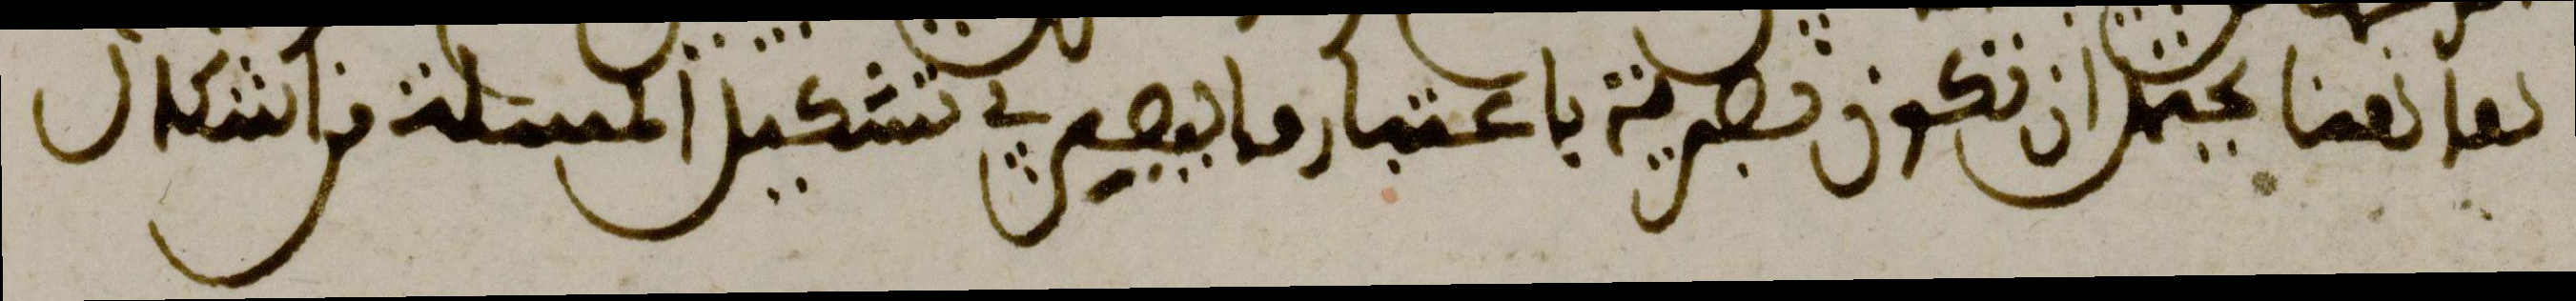هاهنا يحتمل ان تكون بصرية باعتبار ما يبصر في تشكيل المسلة من اشكال
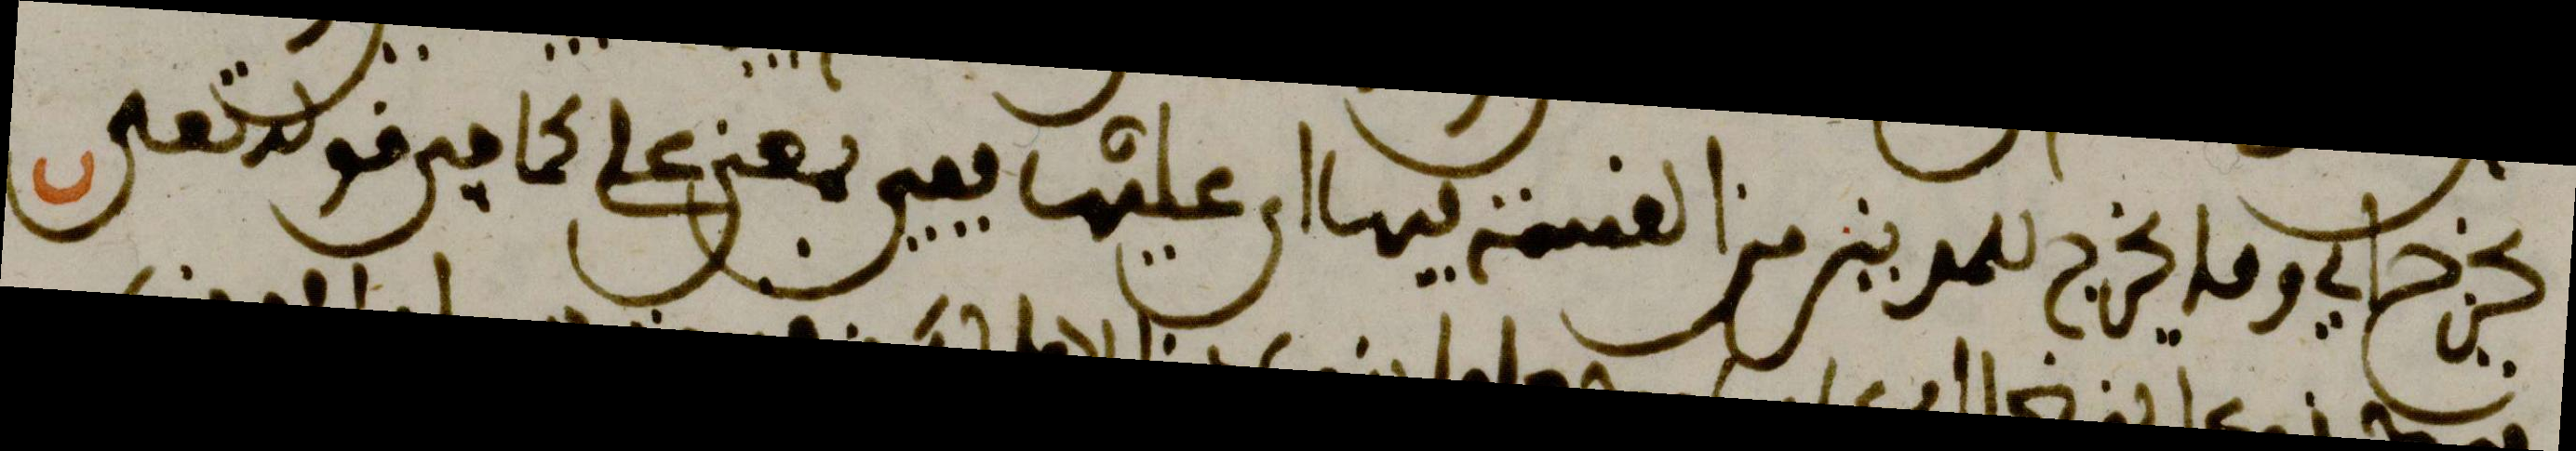يخرج اي وما يخرج المدين من القسمة فيها اي عليْها ففي بمعنى على كما في قوله تعلى
